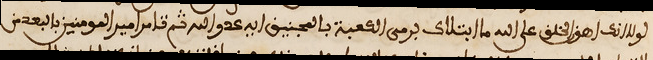لولا انك اهون الخلق على الله ما بتلاك برمى الكعبة بالمجنيق ايه عدو الله ثم تامر امير المومنين بالبعد من
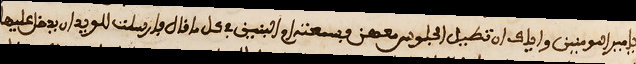يا امير المومنين واياك ان تطيل الجلوس معهن فسمعته ام البنين في كل ما قال فارسل للويد ان يدخل عليها
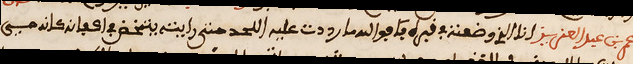عمر بن عبد العزيز انا الذي وضعته في قبره فا فو الله ما رددت عليه اللحد حتى ايته يتخض في اكفانه كانه حي
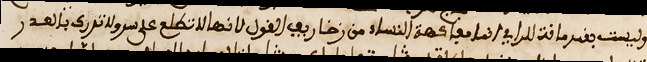وليست بقهر مانة للراي انما مفاكهة النساء من زخاريف القول لانها لا تطلع على سرو لا تدرك بالعدر
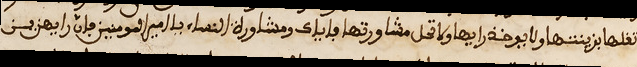تقلها بزينتها ولا يوخذ رايها ولا تحل مشاورتها فاياك ومشاورة النساء يا امير المومنين فان رايهن يمن
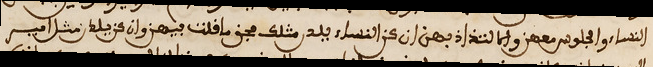النساء والجلوس معهن والا لتذاذ بهن ان كن النساء يلدن مثلك فحق ما قلت فيهن وان كن يلدن مثل امير
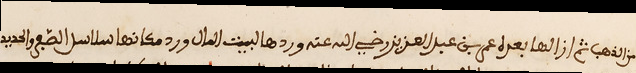من الذهب ثم ازالها بعده عمر بن عبد العزيز رضي الله عنه وردها البيت المال ورد مكانها سلاسل الصفر والحديد
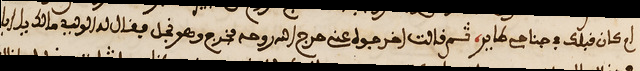ام كان قبلك في جناحى طاير ثم قالت اخرجوه عنى حرج الله روحه فخرج وهو خجل فقال له الوليد مالك يا ابا
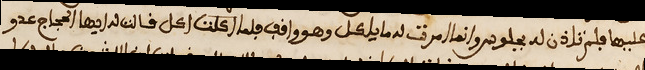عليها فلم تاذن له بجلوس وانما امرت له ما ياكل وهو واقف فلما اكلت اكل قالت له ايها الحجاج عدو
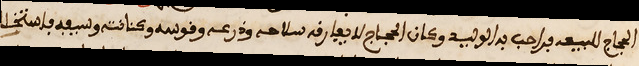الحجاج للبيعه فراحب به الوليد وكان الحجاج لا يفارقه سلاحه وذرعه وقوسه وكنانته وسيفه فاستخلا
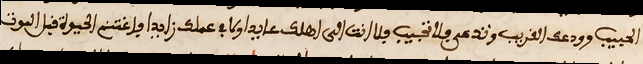الحبيب وودعك القريب وتدعى فلا تجيب فلا انت الى اهلك عايد ولا في عملك زايدا فاغتنم الحيوة قبل الموت
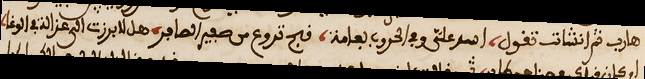هارب ثم انشات تقول اسد على وفي الحروب بعامة فبح تروع من صفير الصافر هل لا برزت الى عزالة في الوغل
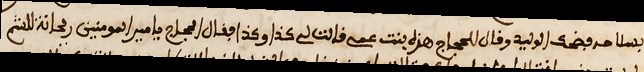بسلاحه فضحك الوليد وقال للحجاج هذه بنت عمى قالت لى كذا وكذا فقال الحجاج يامير المومنين ريحانه للشم
